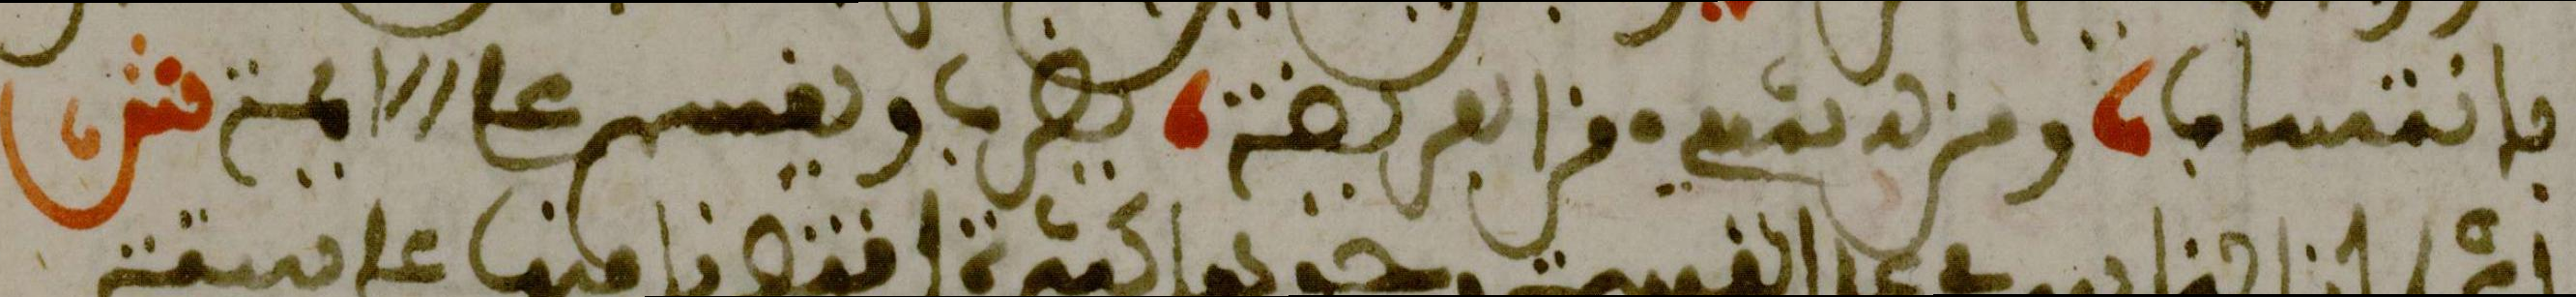بانتساب ومن له شيء من الفريضة يضرب ويقسم على الايمة ش
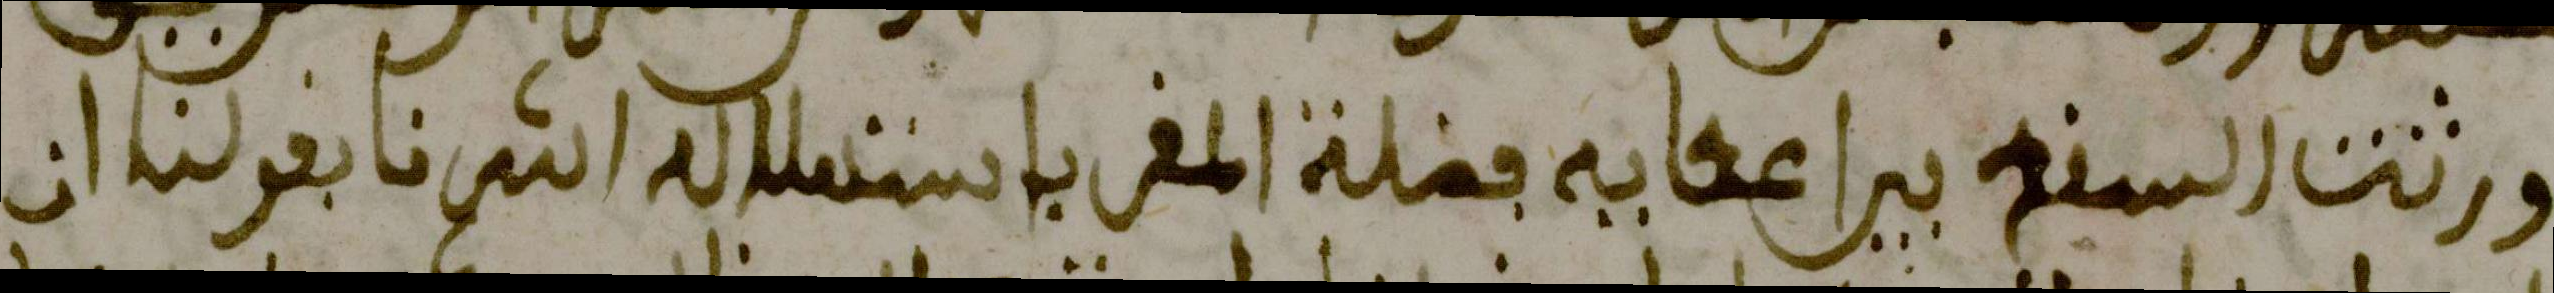ورثت السقط في اعطايه فضلة المقر باستهلاله اشرنا بقولنا ان
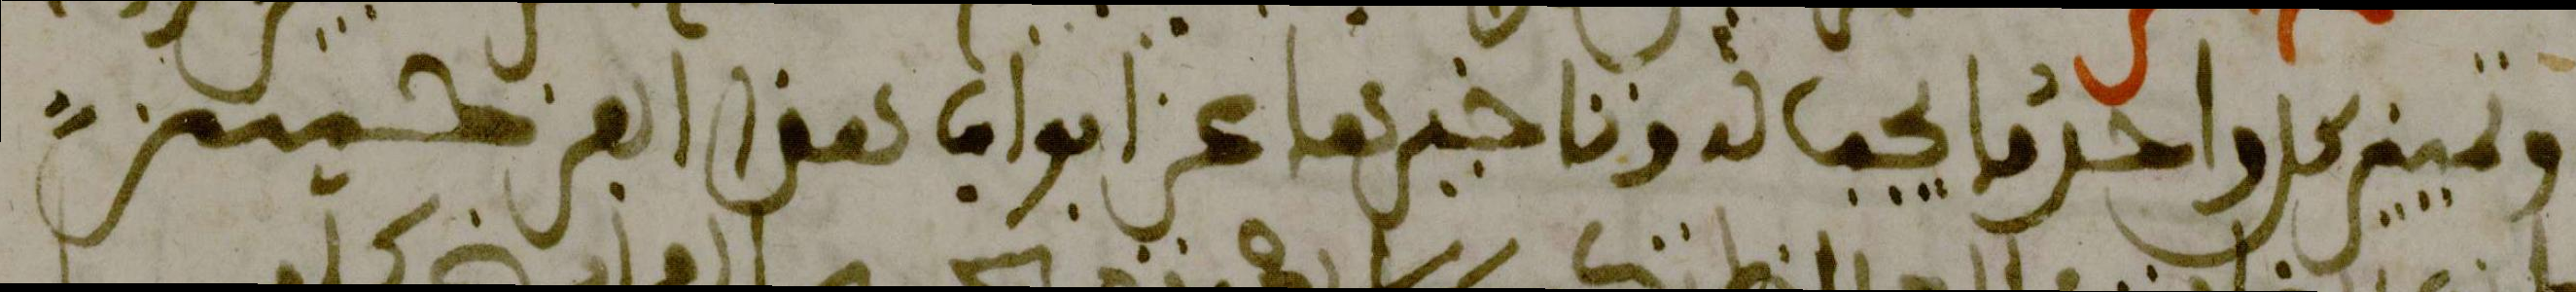وتمييز كل واحد ما يجب له وتاخيرها عن ابواب هذا الفن حسن
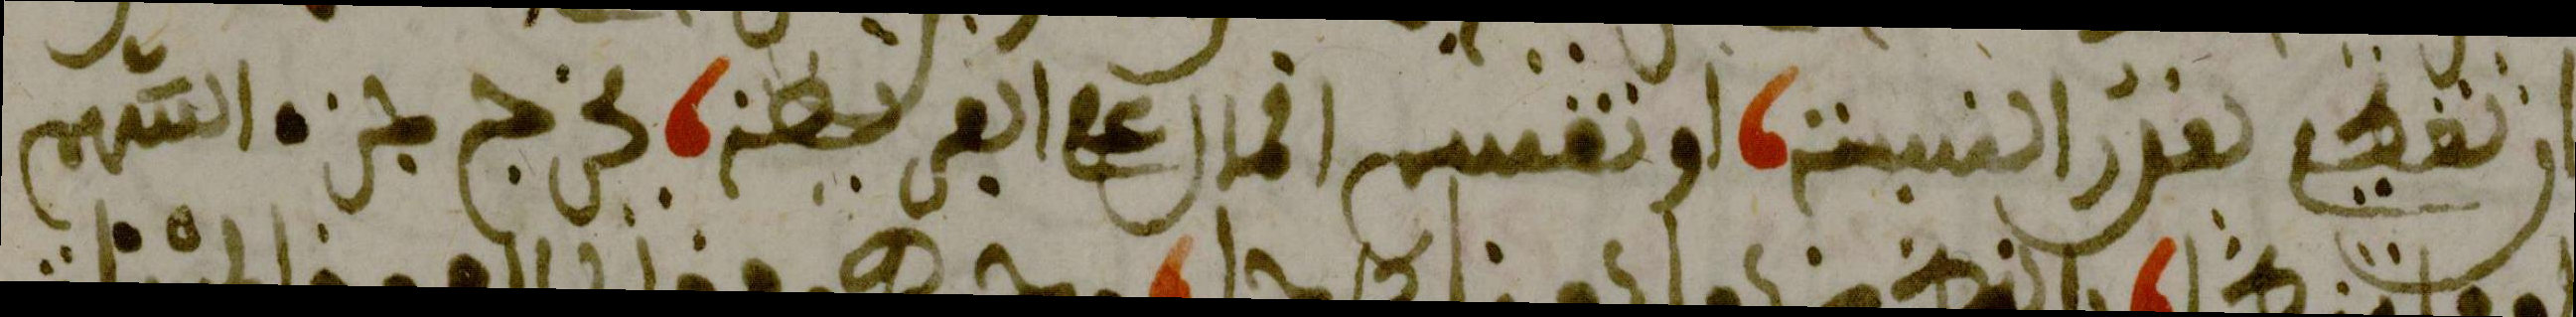ان تعطي بقدر النسبة اوو تقسم المال على الفريضة يخرج جزء السَّهم
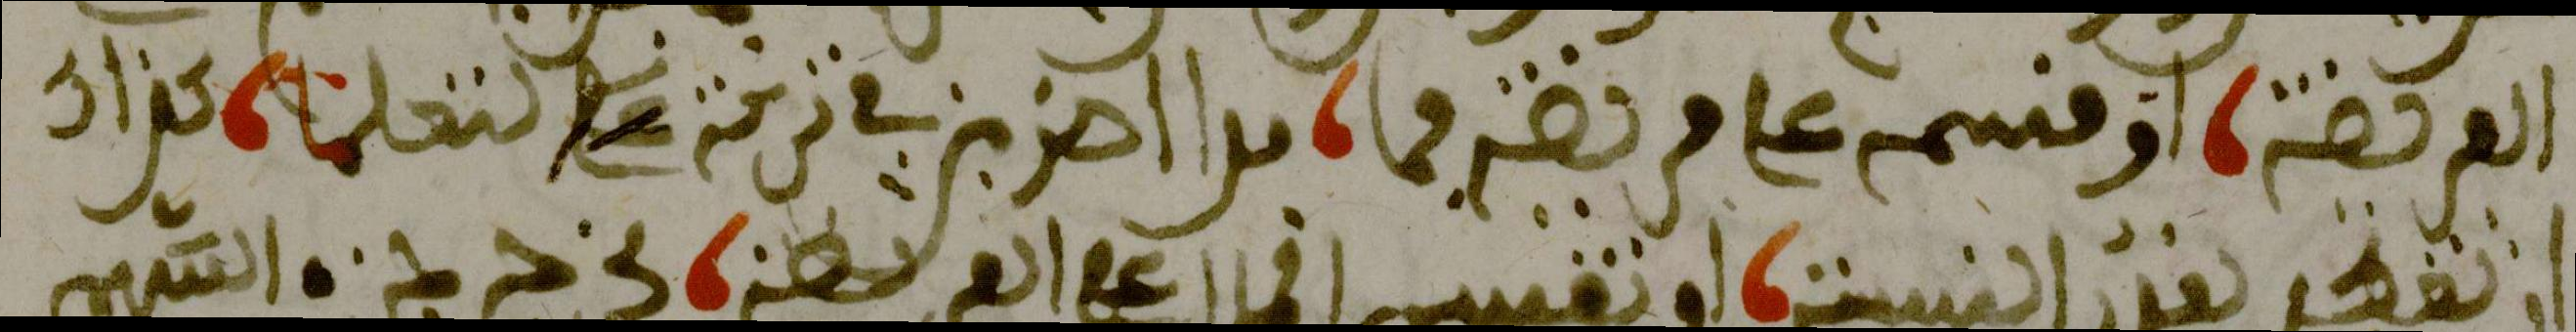الفريضة او قسمه على فريضة فما بدا اضربن في تركة على لتعلما كذاك
